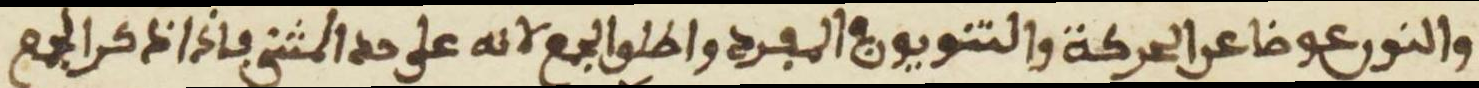و النون عوظ و التنويون المفرد و اطلق الجمع لانه على حد الثنى فاذا ذكر الجمع
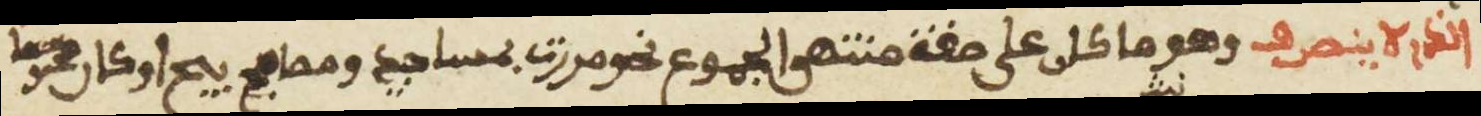الذي لا ينصرف و هو ما كان على صغة منتهى الجموع نحو مررت بمساجد و مصابيح او كان
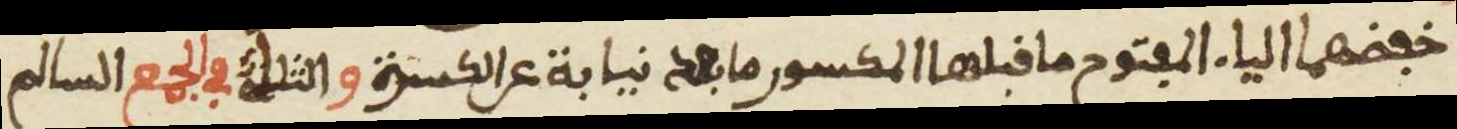خفضهما الياء المفتوح ما قبلها المكسور ما بعد نيابة عن الكسرة و الثاني في الجمع السالم
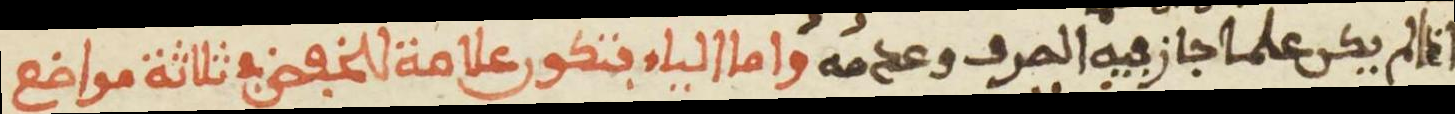اذا لم يكن علما جاز فيه الصرف و عدمه و اما الياء فتكون علامة للخفض في ثلاثة مواضع
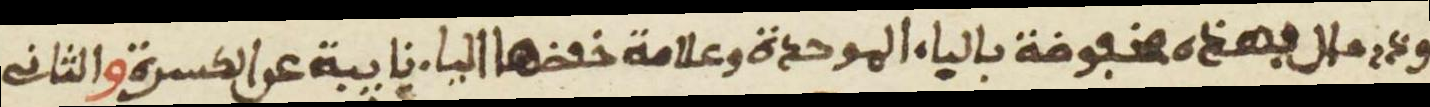و ذو مال فهذه مخفوضة بالياء الموحدة و علامة خفضها الياء نائبة عن الكسرة و الثاني
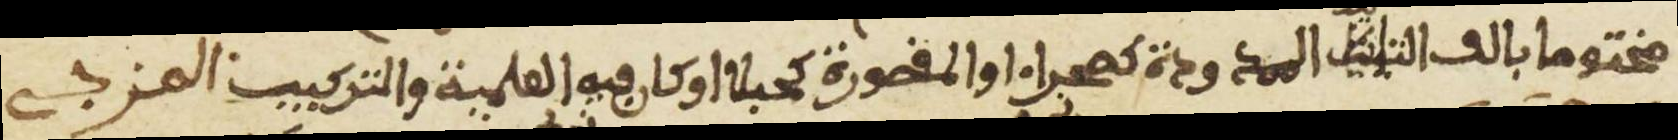مختوما بالف التانيث الممدودة كصحراء او المقصورة كحبلا او كان فيه العلمية و التركيب
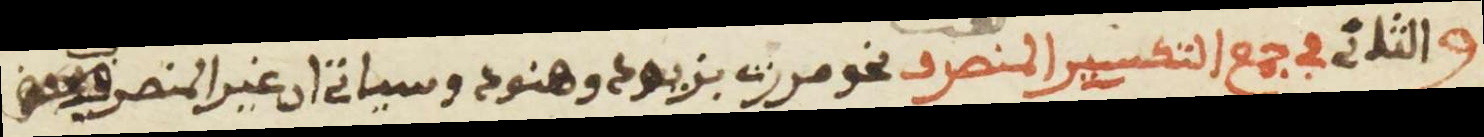و الثاني في جمع التكسير المنصرف نحو مررت بزيود و هنود و سياتي ان غير المنصرف
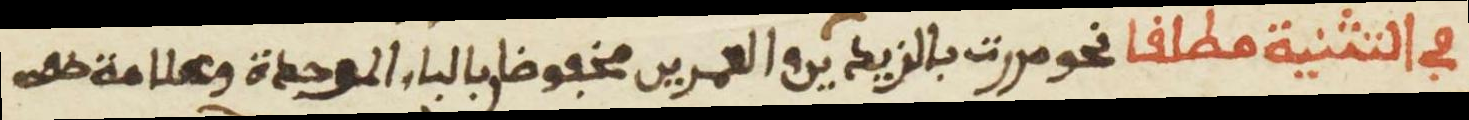في التثنية مطلقا نحو مررت بالزيدين و العمرين مخفوضان بالباء الموحدة و علامة
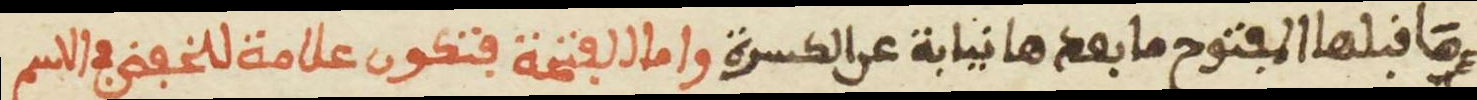ما قبلها المفتوح ما بعدها نيابة عن الكسرة و اما الفتحة فتكون علامة للخفض في الاسم
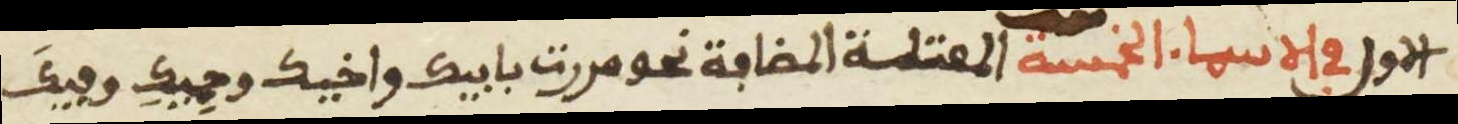الاول في الاسماء الخمسة المعتلة المضافة نحو مررت بابيك و اخيك و حميك و فيك
